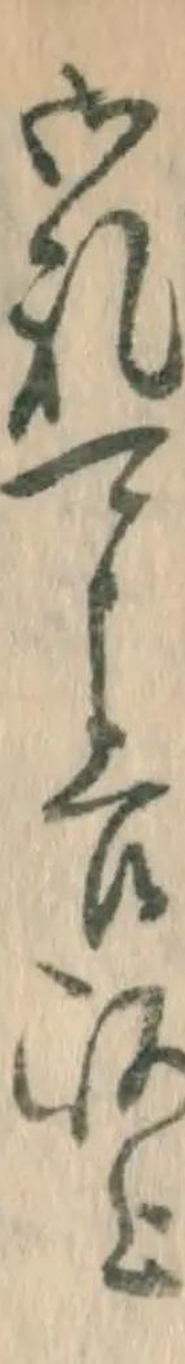御礼可申上候以上
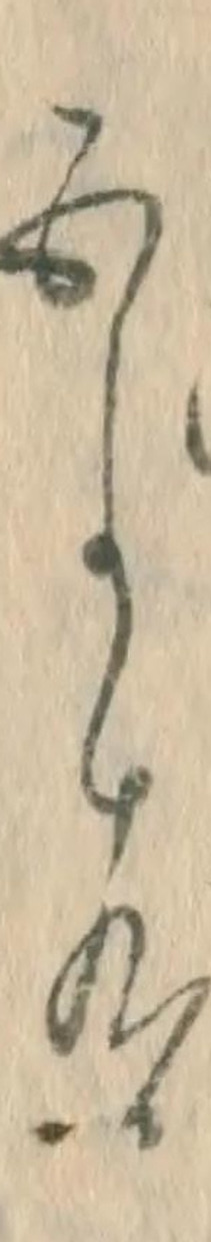五月十九日
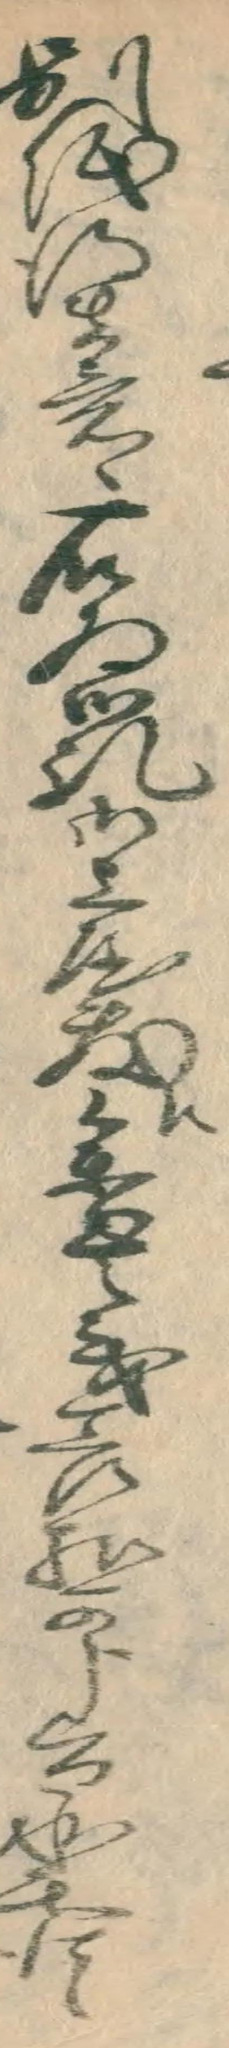別紙得貴意候右為御礼御上屋敷江参上之義差扣可申旨承知仕候
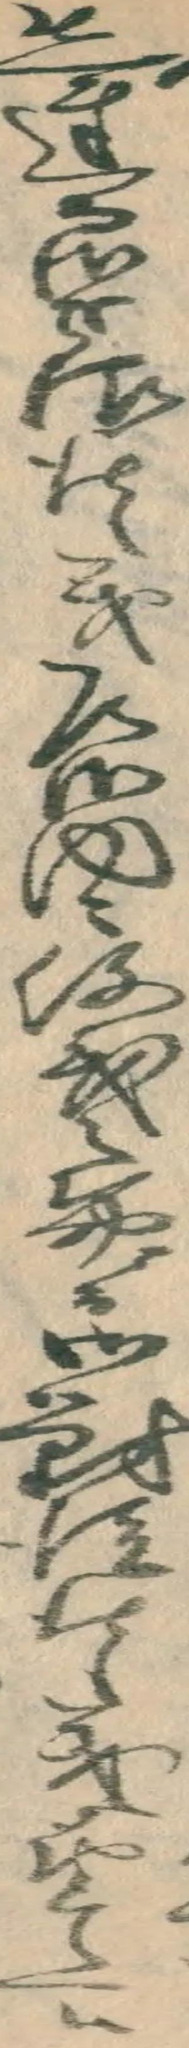先達而御世話仕候義乍御内々役義之筋ニ而御対談仕候義御座候へハ
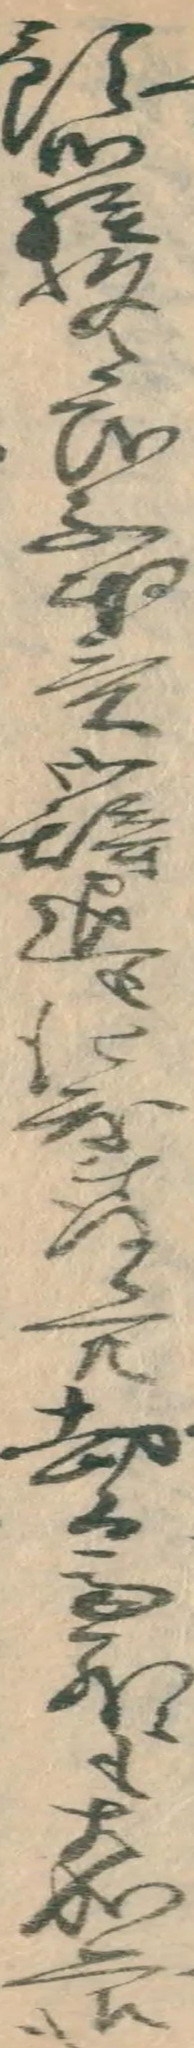預御挨拶候も不本意御辞退も仕度奉存候へ共却而慮外ニも相成思召も
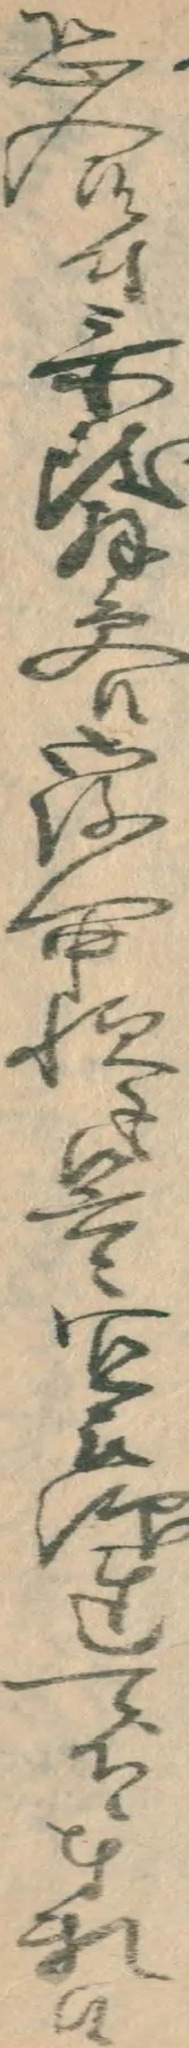恐入候ニ付忝致拝受候御役人中様へも呉々宜被仰達可被下候奉頼候

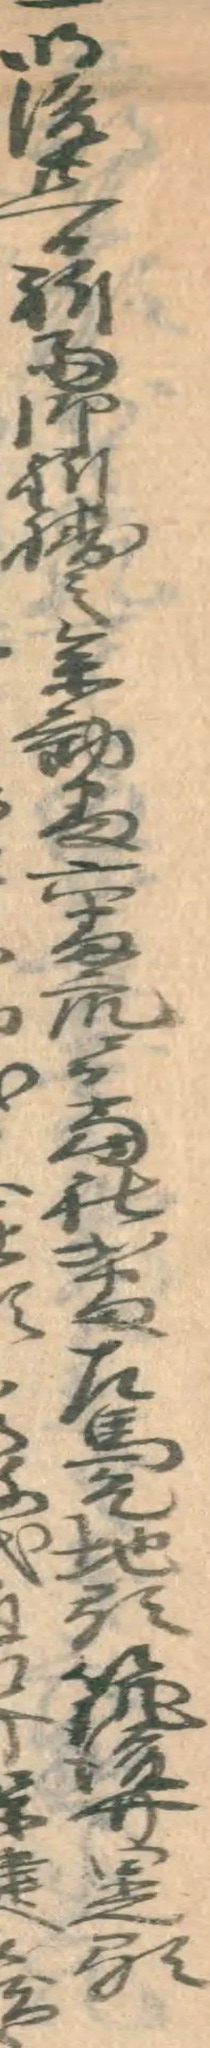一明後廿一日祈雨御祈祷之参勤番六番衆ニ而当社出番左馬允地顕筑後介晃顕
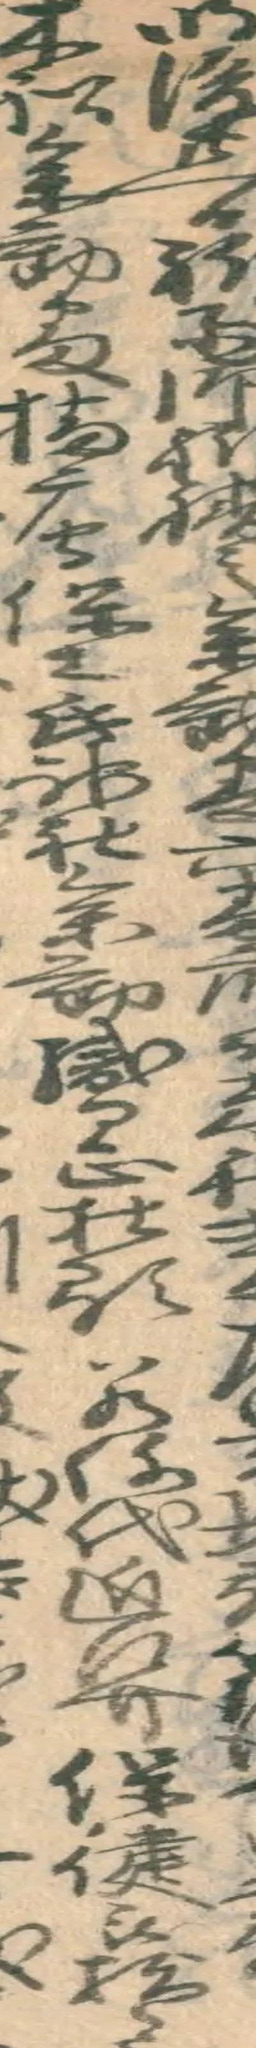木船参勤番播磨守保土氏神社参勤織部正杜顕若役代近江介保健被指候也
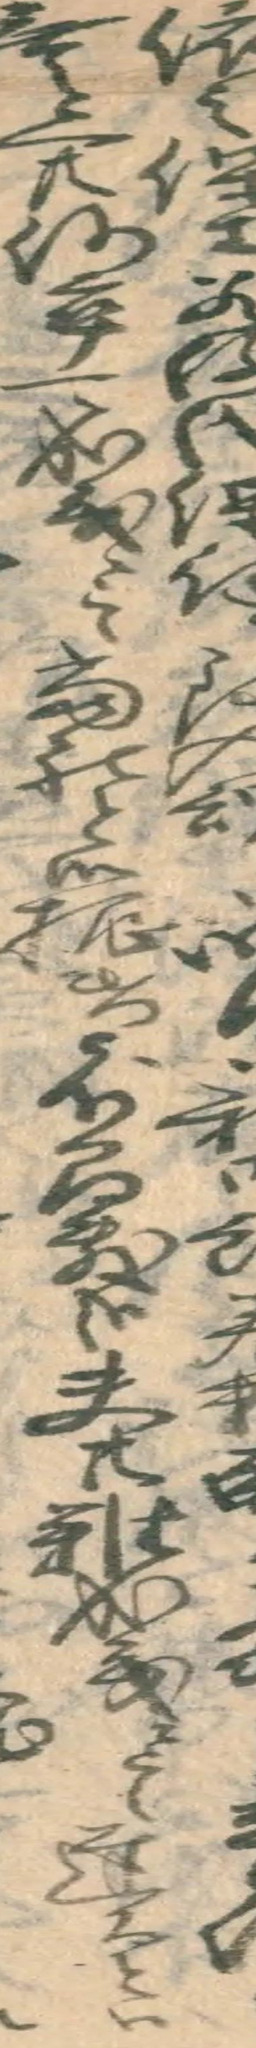無之候へ共何卒可成義ニ候ハヽ当社と御振替被下間敷哉夫共難成義ニ候ハヽ達而とハ
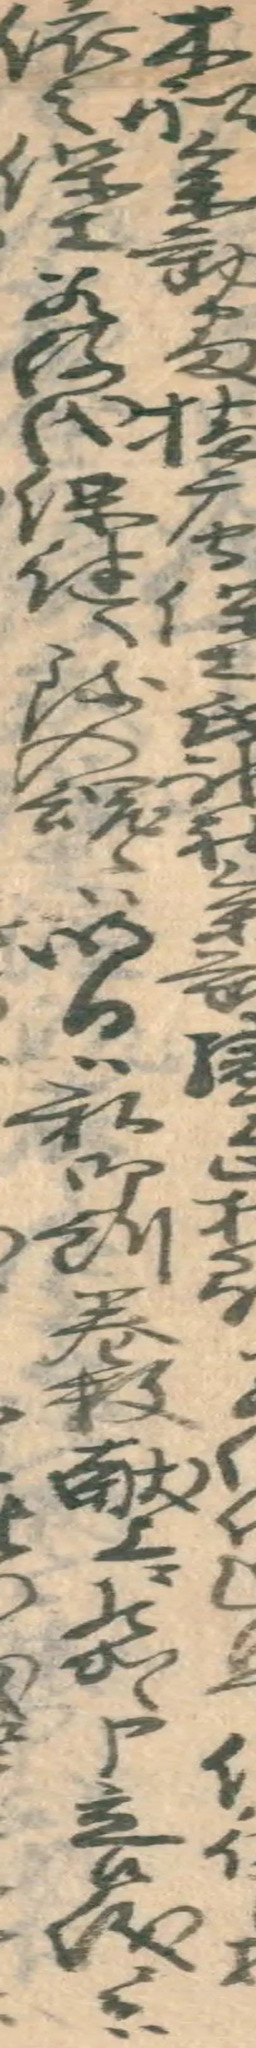依之保土若役代保健へ致入魂候ハ明日ハ私御所巻数献上ニ罷出候申立候儀ニ而ハ
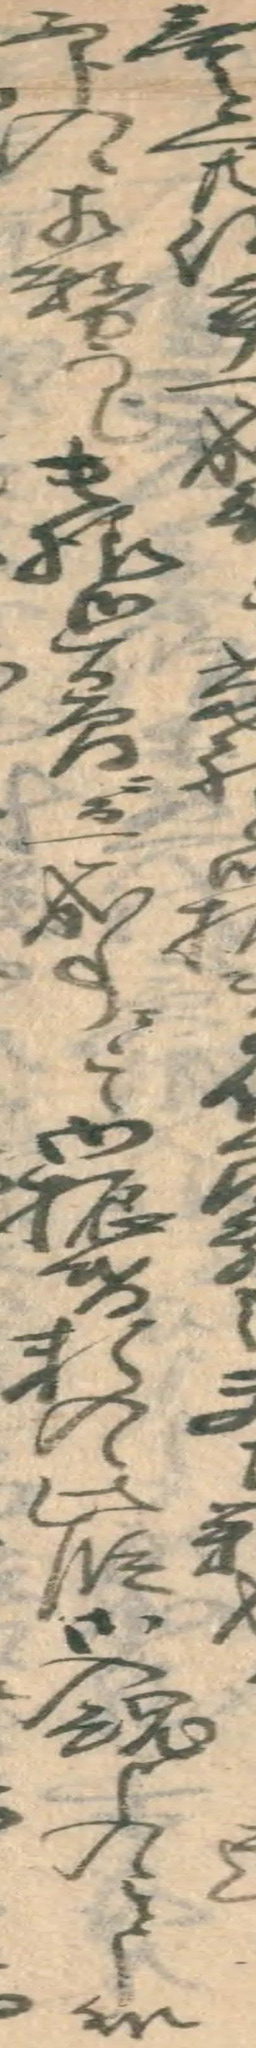不申入候相務可申候貴様御了簡ニ而可成事ニ候ハヽ御振替頼入候此段御入魂申入候と申処
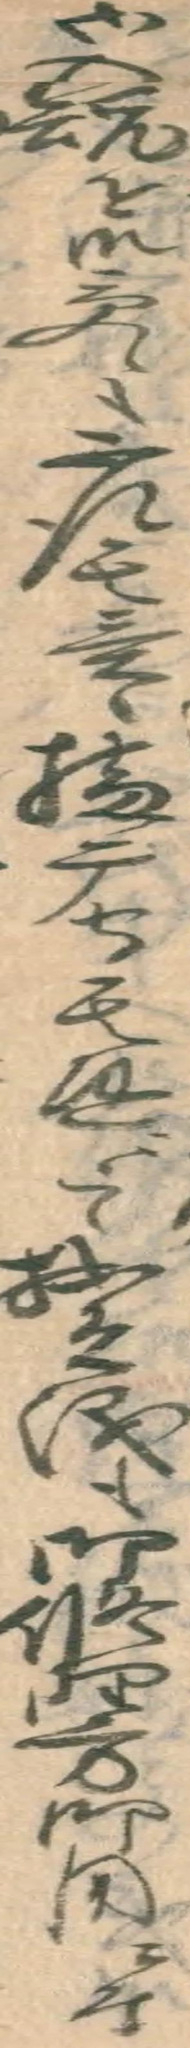御入魂を御受候も不得其意候播磨守其通ニ候ハヽ拙者儀も御修理方御用ニ付
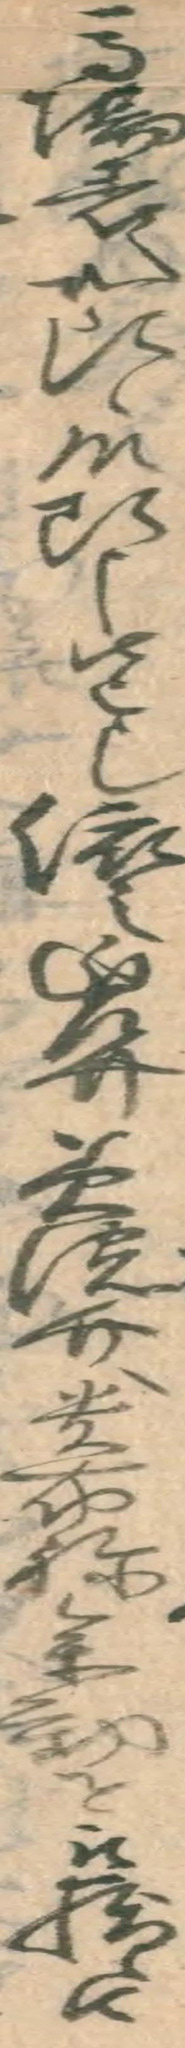馬場表へ出頭候故断申候由被申候依之近江介美濃介へ貴布祢参勤を被指候由
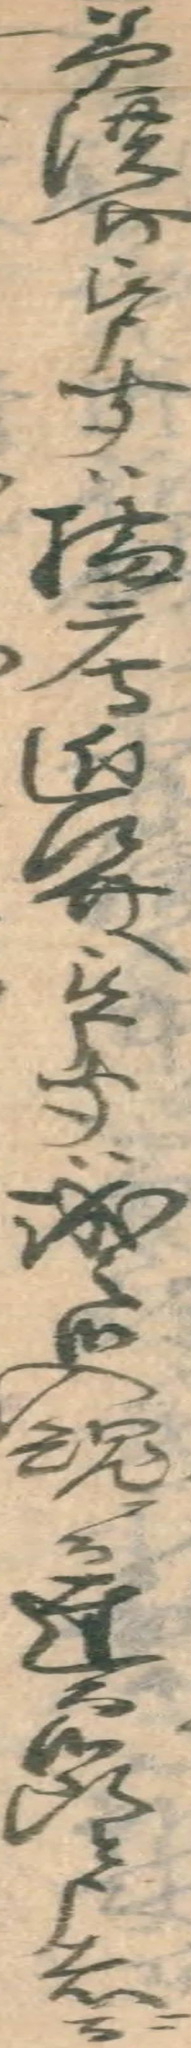美濃介被申聞ハ播磨守近江介へ被申聞ハ誠之御入魂ニ而達而御断と申者ニ而ハ
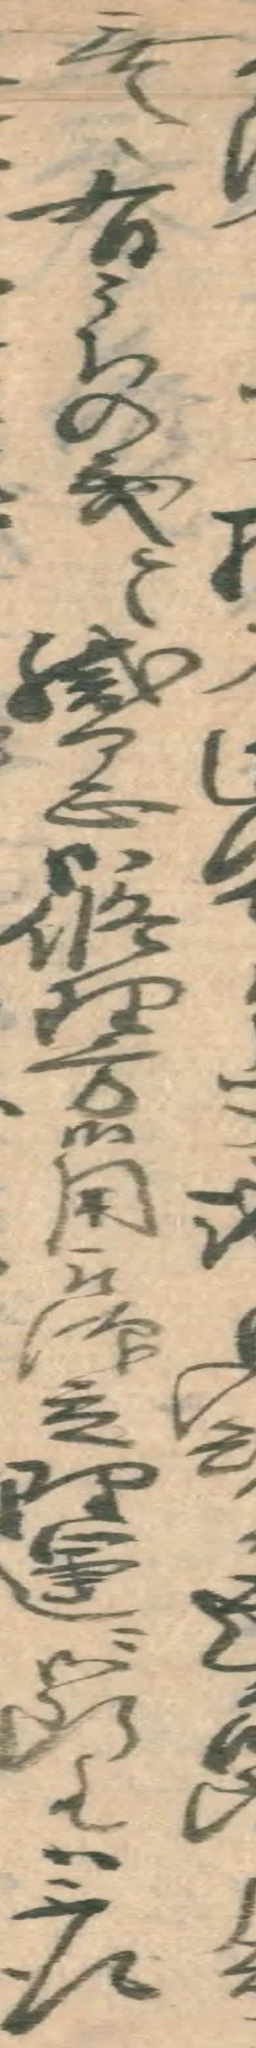無之候有うちの義ニ候織部正御修理方御用被仰立理運ニ御断候てハ不得
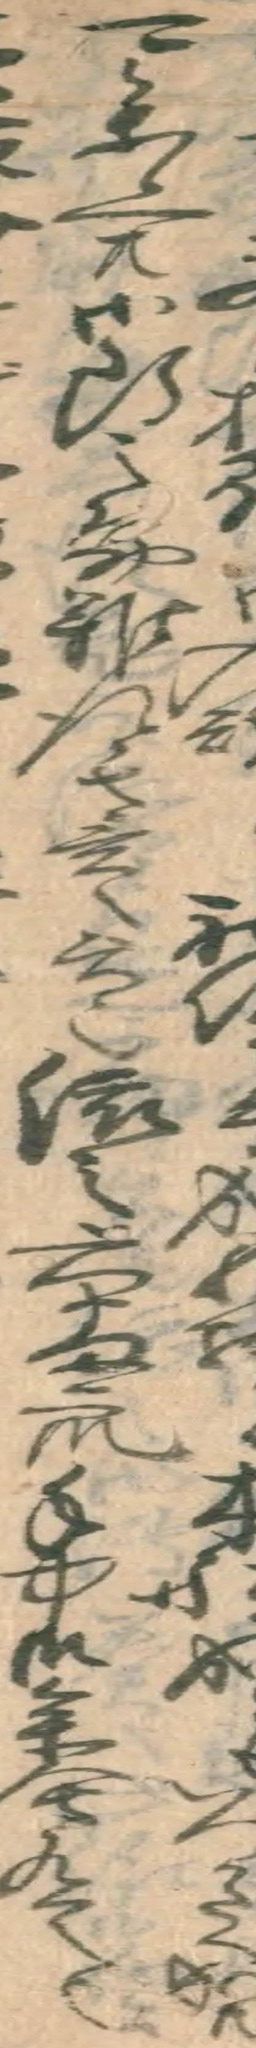可参候へ共御断之筋難得其意之旨也依之六番衆手中御参会有之也
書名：賀茂社記録. 第58冊
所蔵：国立国会図書館 National Diet Library, JAPAN
